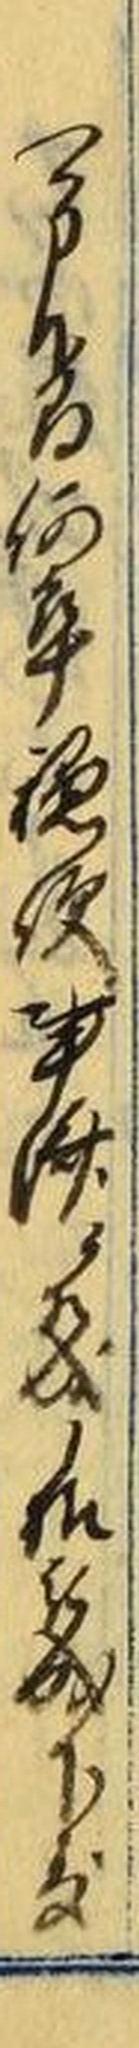可申候間何卒穏便事済に相成候様被成下度

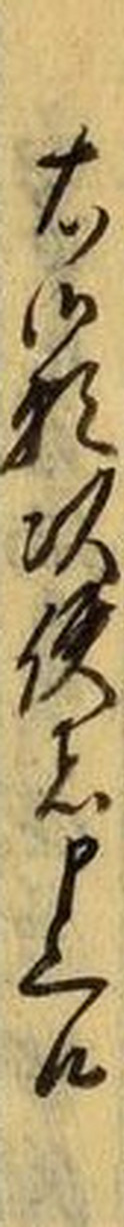右御願以使者申上候
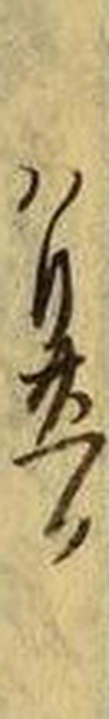九月廿二日
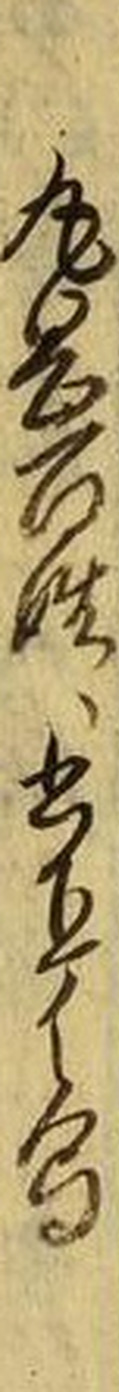丸岡百姓へ書下ヶ之写
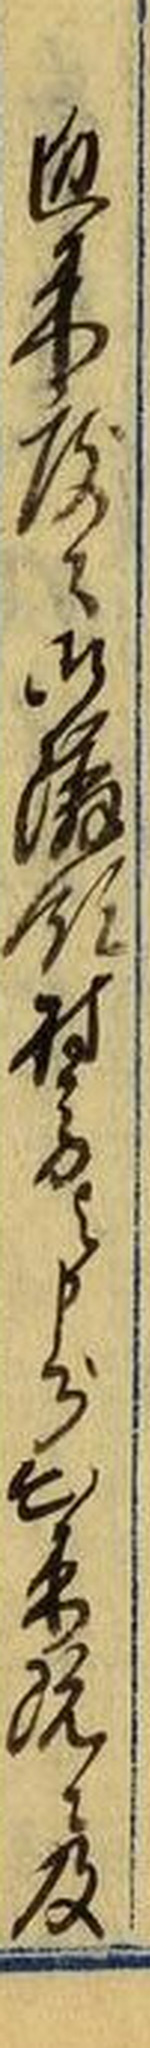近来度々御隣領村々方と申分出来既に及
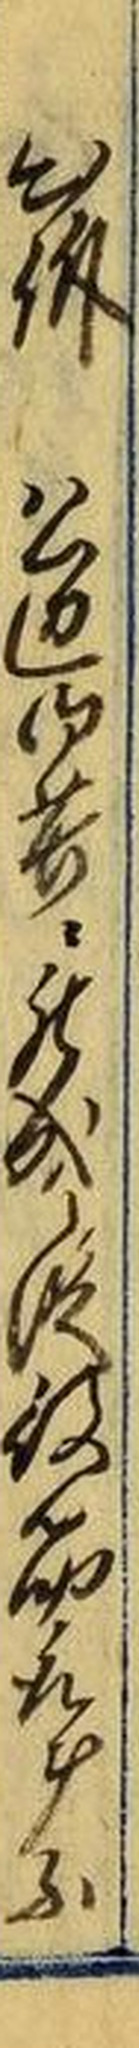出訴公辺御苦に罷成候段役筋取計不
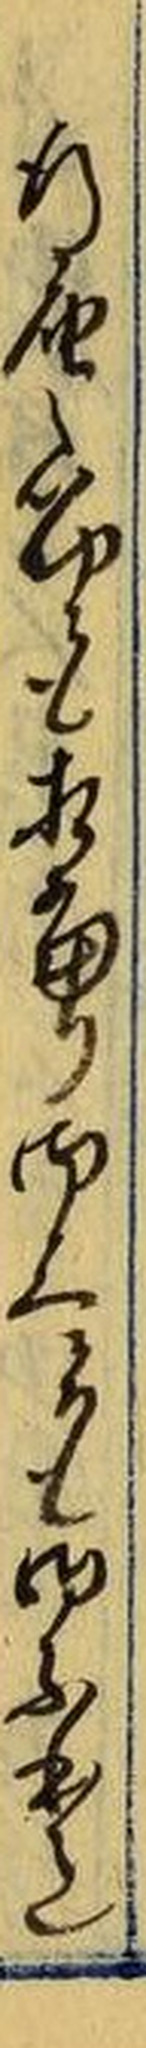行届之筋にも相当り御上に而も御不本意
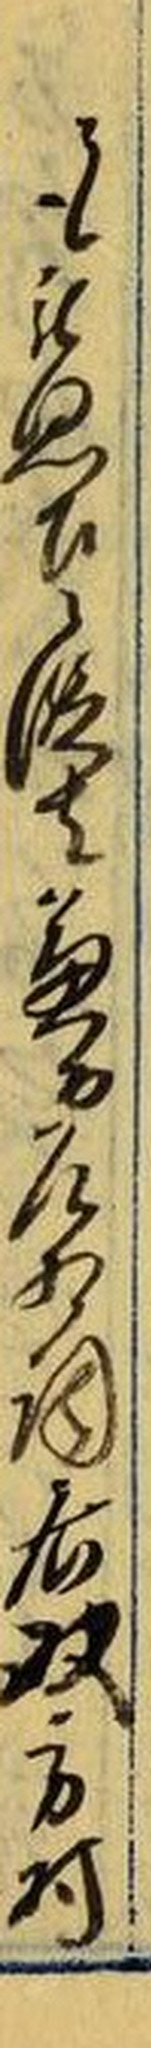にも被思召候段は兼而乍相調居双方村
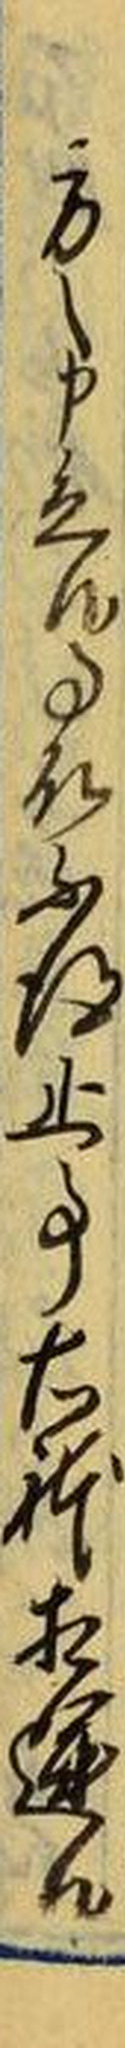方之申立候事故不得止事右躰相運候
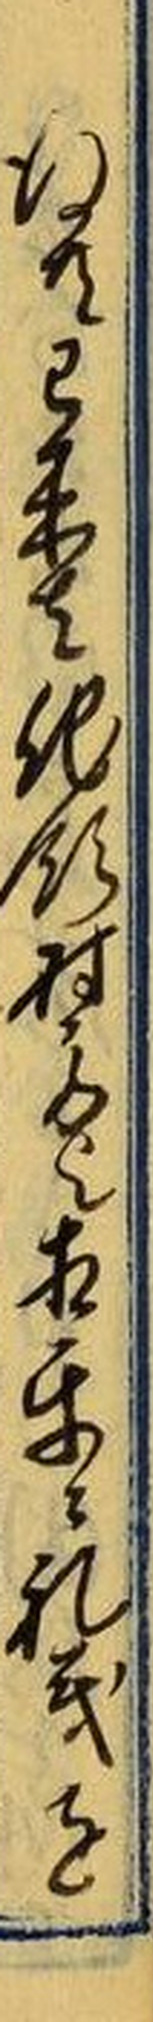得共已来は他領村方と相互に礼義を
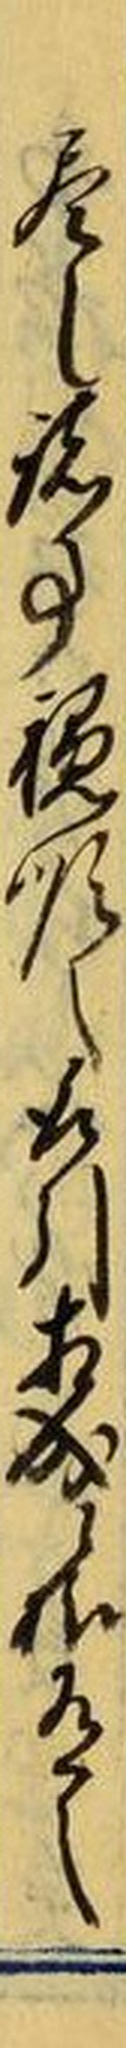尽し諸事穏順之取引相成候様有之
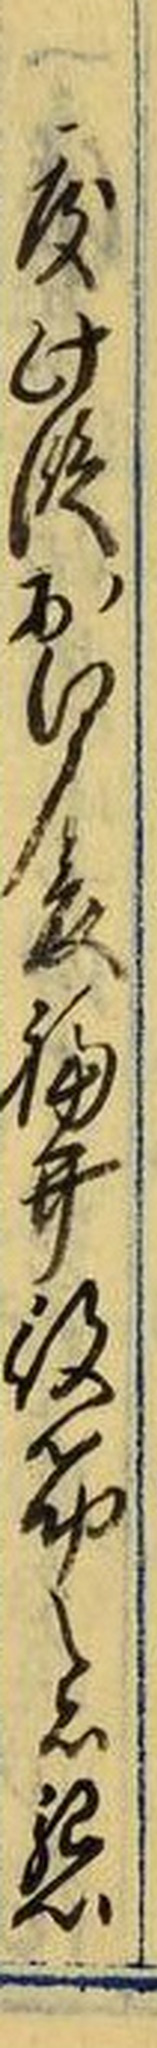度此段於江戸表福井役筋之者懇
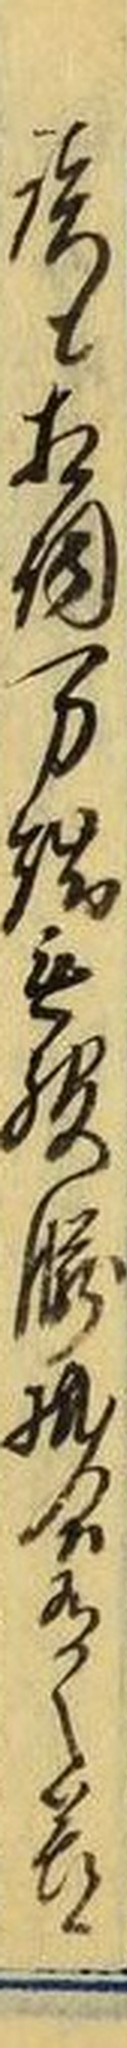談も相調万端無腹臓掛合有之筈候
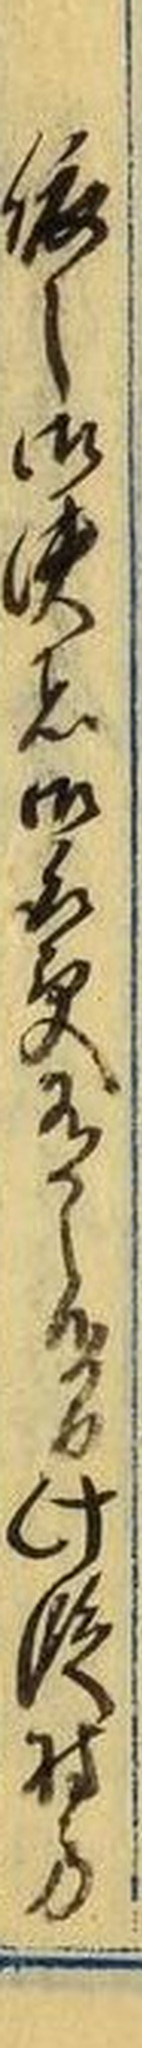依之御使者御取交有之候間此段村方
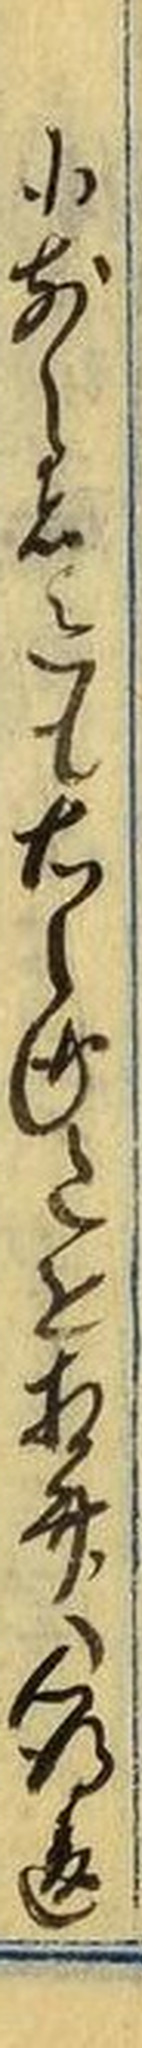小前之者迄も右之趣意を相弁へ心得違
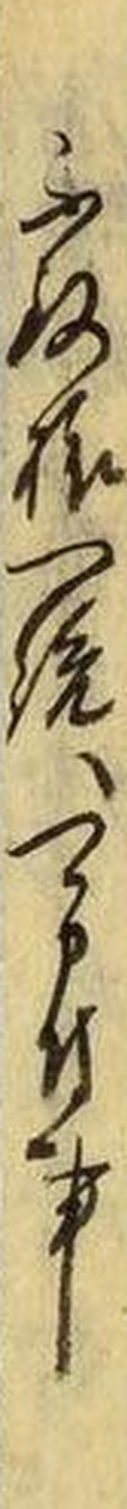不致様一統へ可申付事
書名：温古集 五巻
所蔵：福井県文書館 Fukui Prefectural Archives
